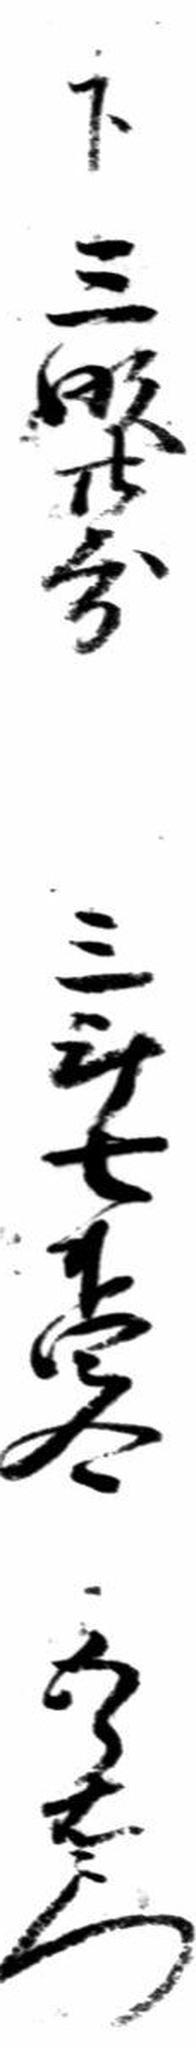下三畝廿歩三斗七升四合五郎右衛門
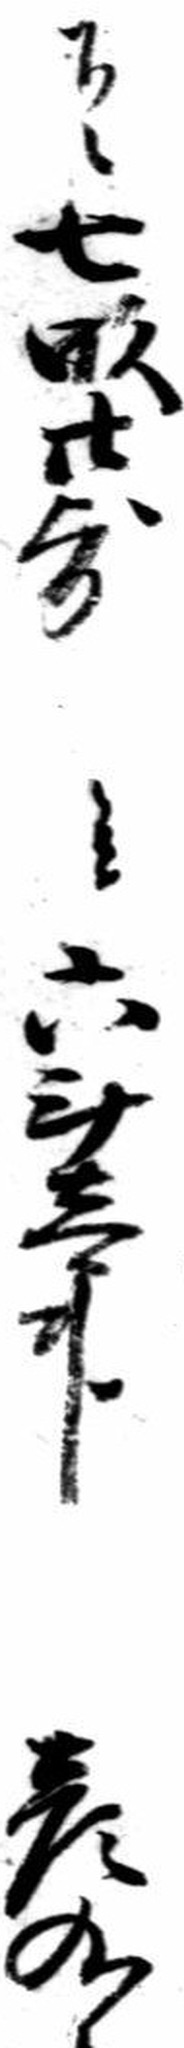下々七畝廿歩六斗壱升彦九郎
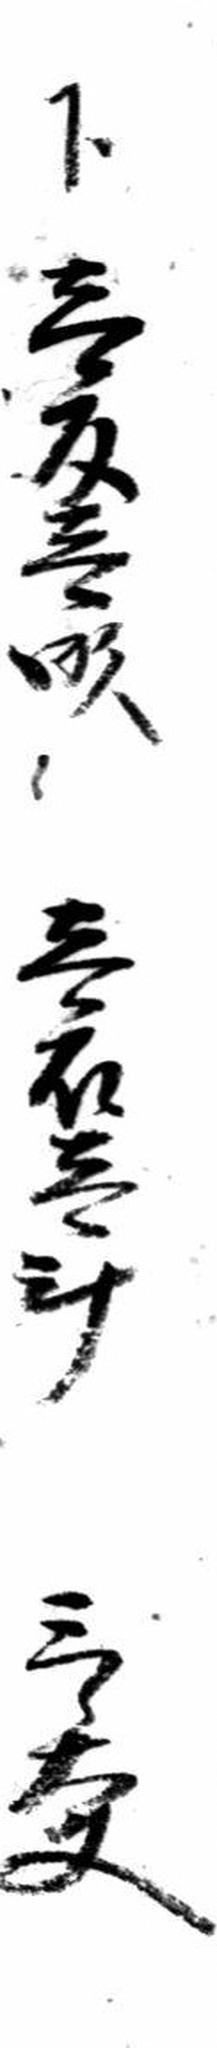下壱反壱畝壱石壱斗三郎大夫
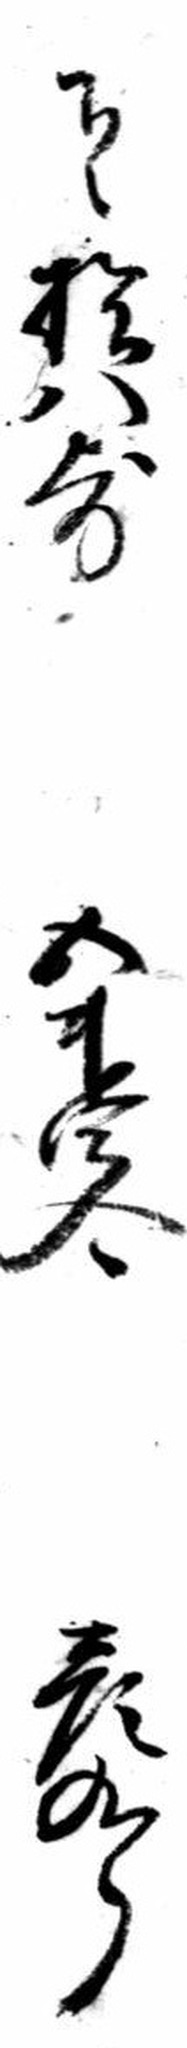下々拾八歩五升四合彦九郎
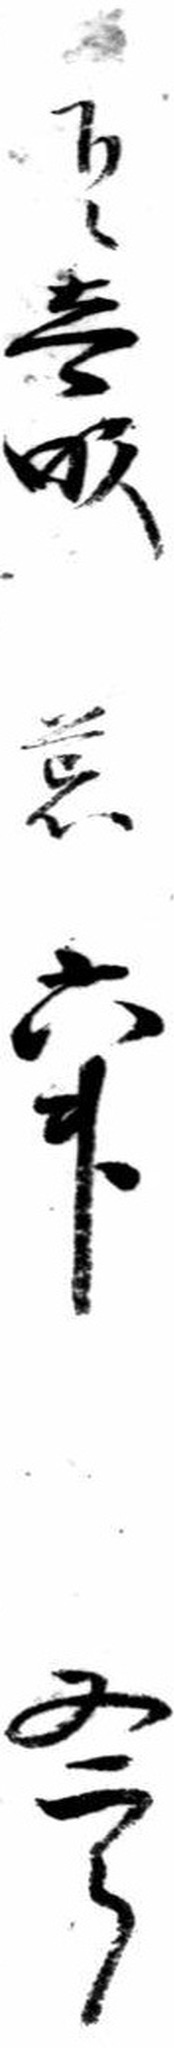下々壱畝荒六升又二郎
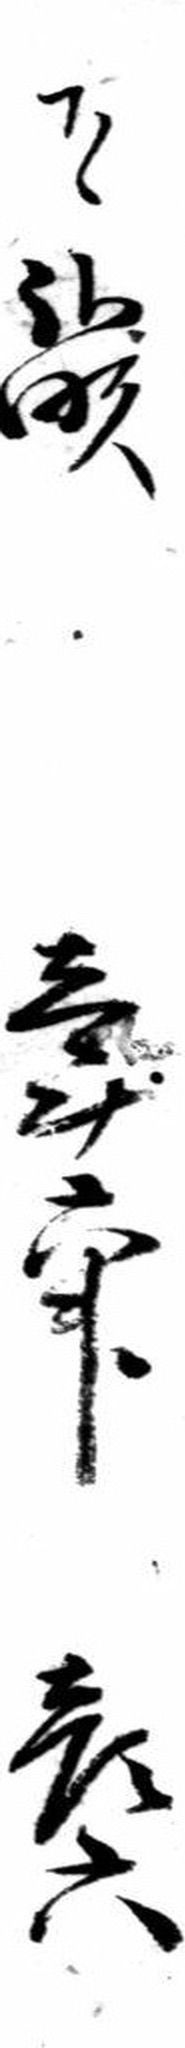下々弐畝壱斗六升彦六
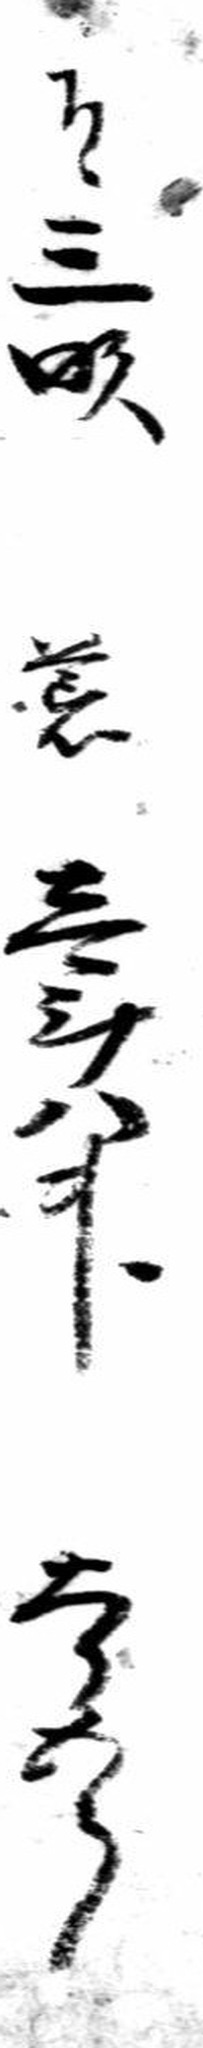下々三畝荒壱斗八升大郎五郎
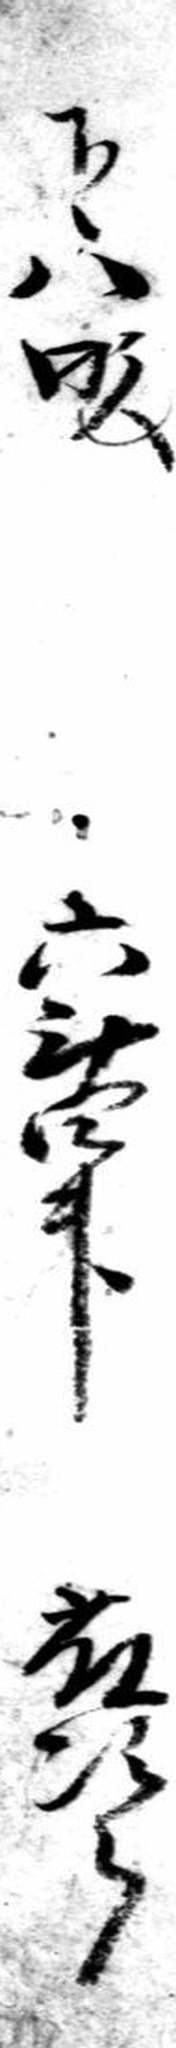下々八畝六斗四升藤次郎

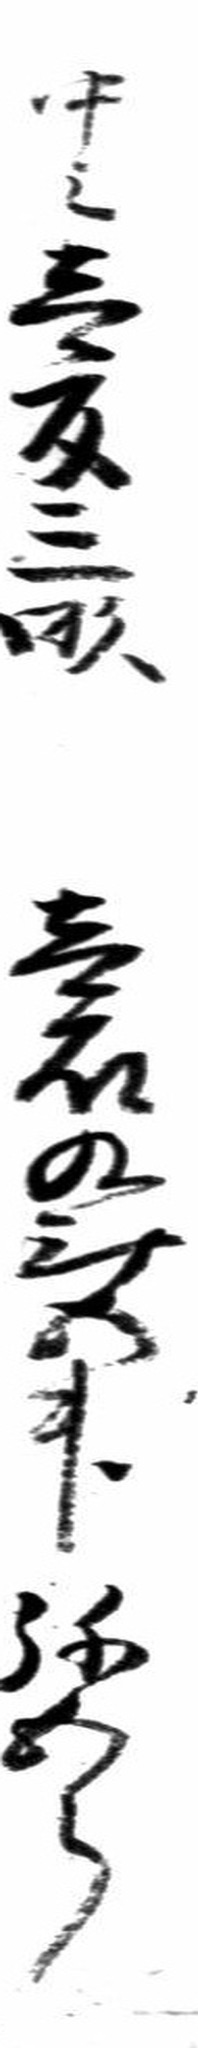中上壱反三畝壱石九斗五升弥五郎
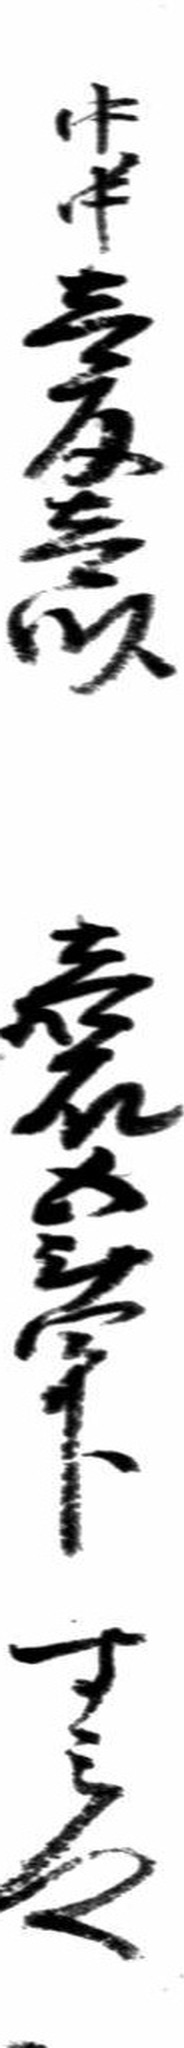中ノ中壱反壱畝壱石五斗四升すみや
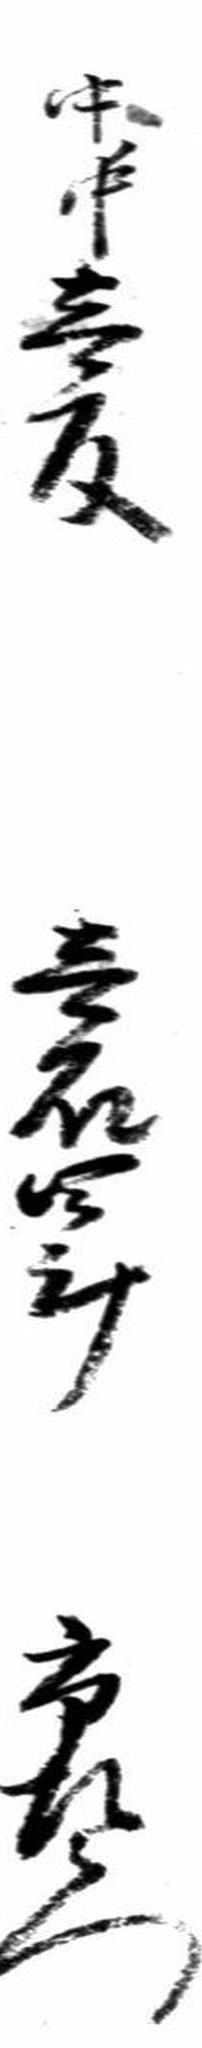中ノ中壱反壱石四斗市左衛門
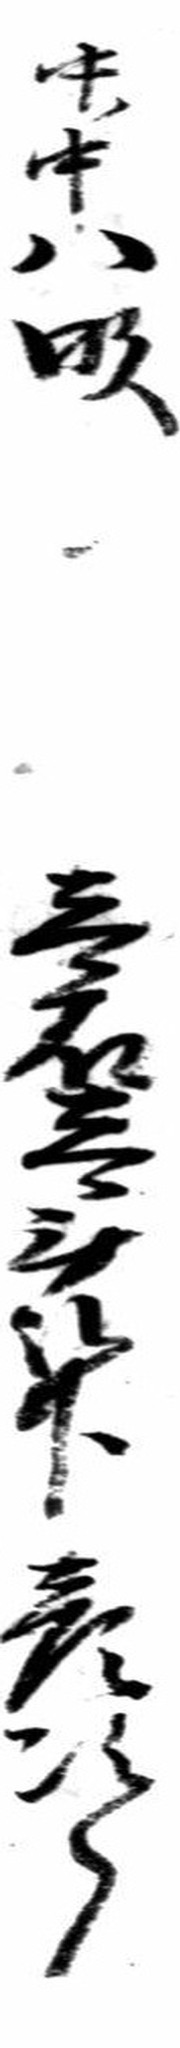中ノ中八畝壱石壱斗弐升彦次郎
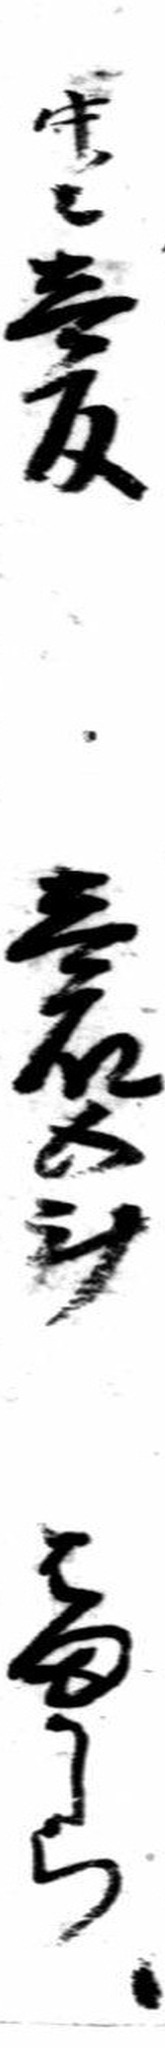中ノ上壱反壱石五斗はまかしら
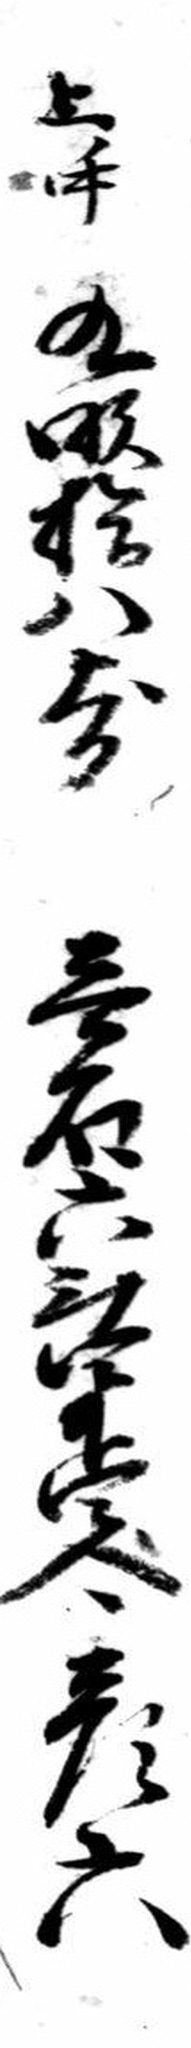上ノ中九畝拾八歩壱石六斗四升四合彦六
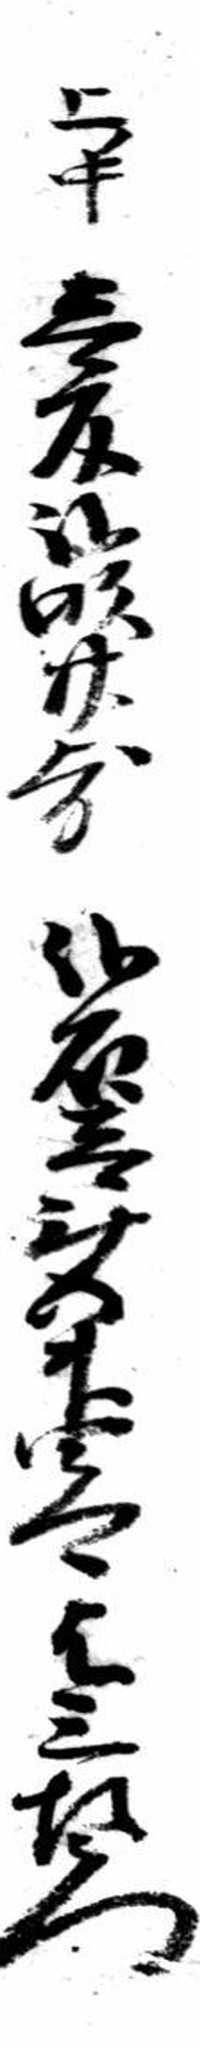上ノ中壱反弐畝廿歩弐石壱斗五升四合与三左衛門
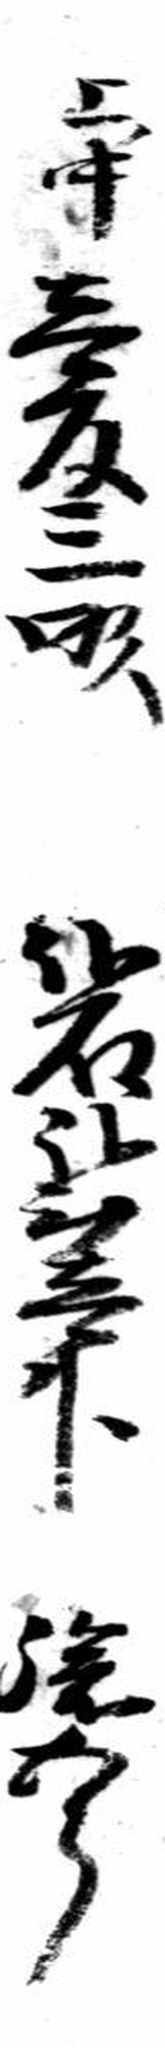上ノ中壱反三畝弐石弐斗壱升孫五郎
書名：若州三方郡之内世久見浦御検地帳（世久見浦検地帳写）
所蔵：福井県文書館 Fukui Prefectural Archives
